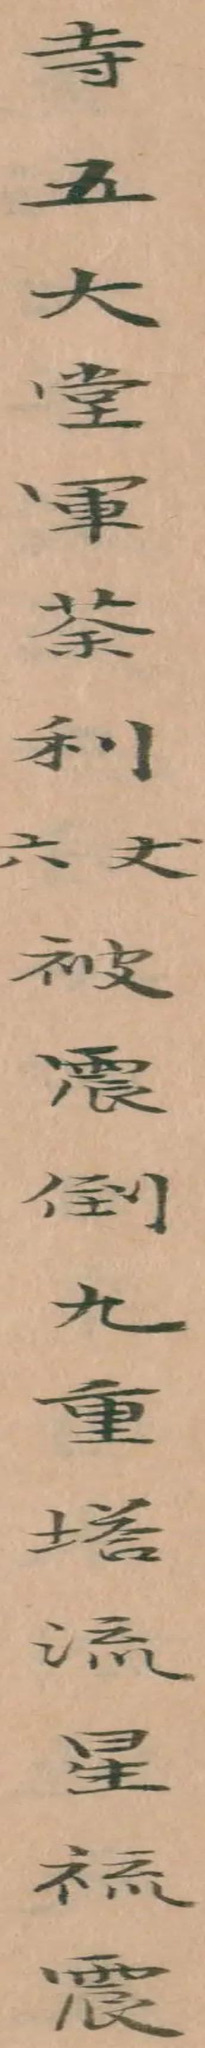寺五大堂軍荼利丈六被震倒九重塔流星震
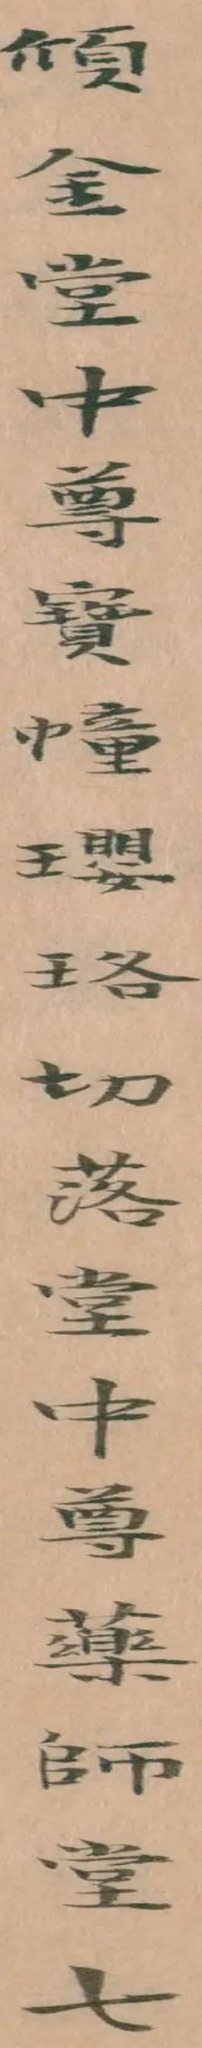傾金堂中尊宝幢瓔珞切落堂中尊薬師堂七
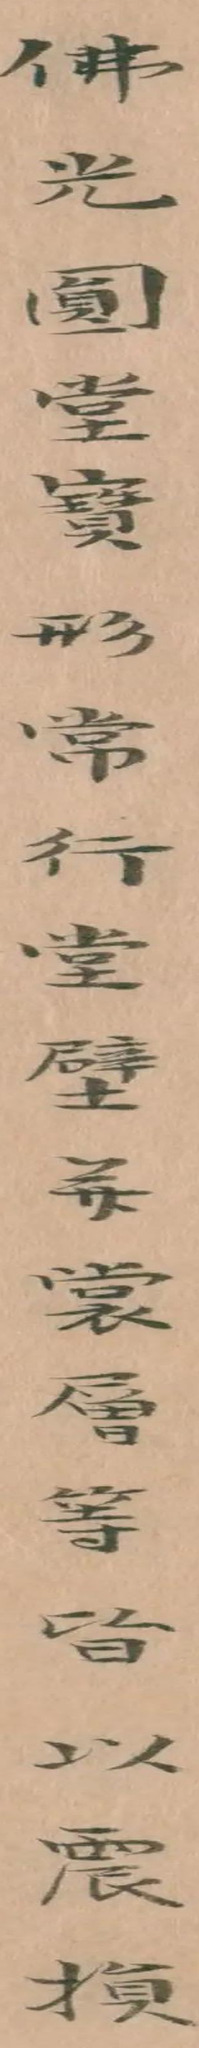仏光円堂宝形常行堂壁幷裳層等皆以震損
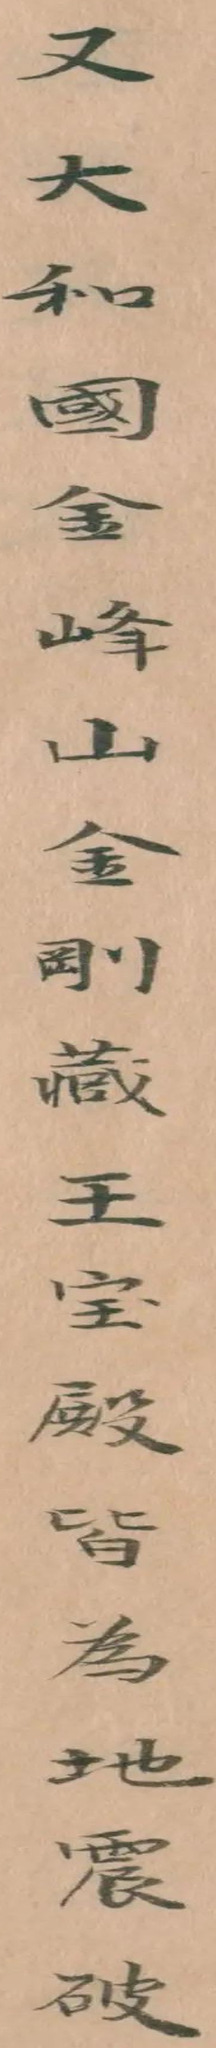又大和国金峰山金剛蔵王宝殿皆為地震破
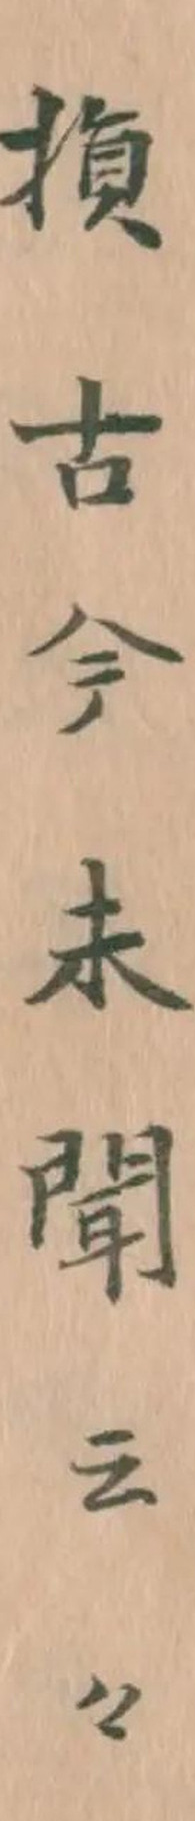損古今未聞云々
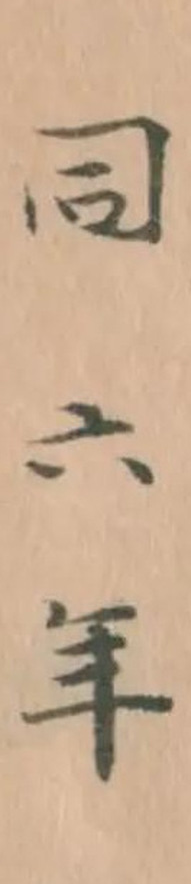同六年

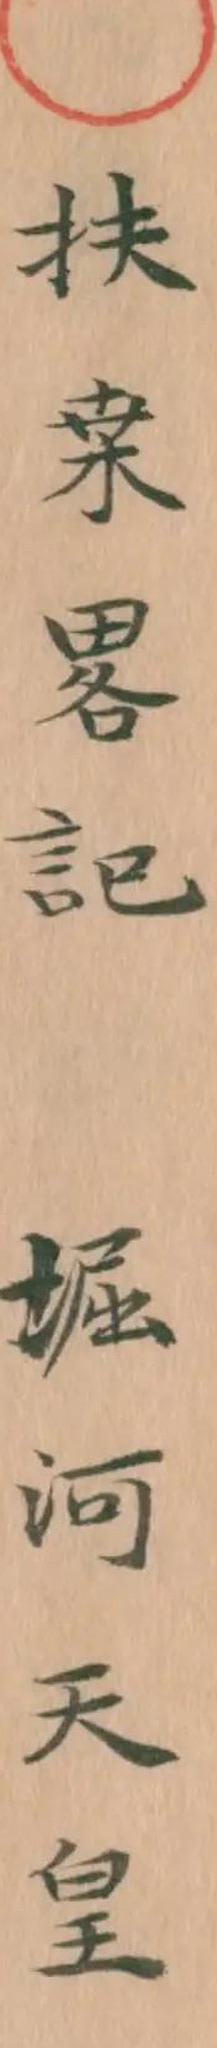○扶桑略記堀河天皇
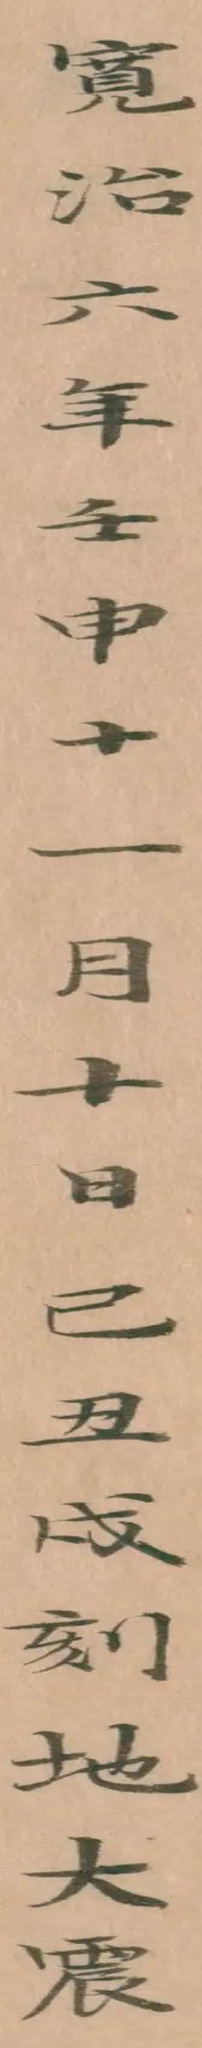寛治六年壬申十一月十日己丑戌刻地大震
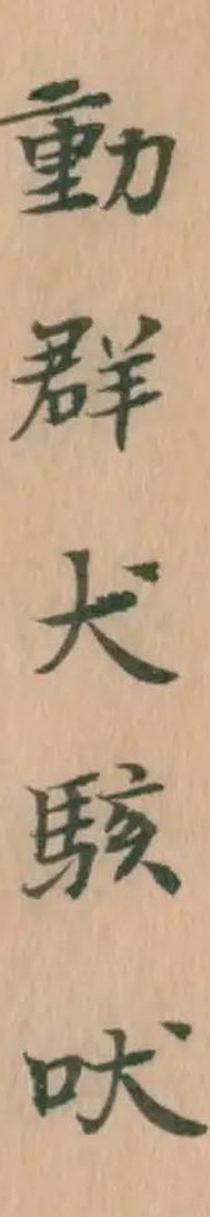動群犬駭吠
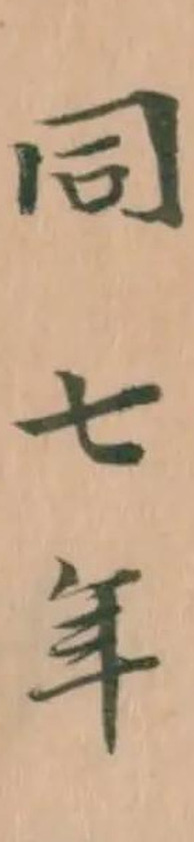同七年
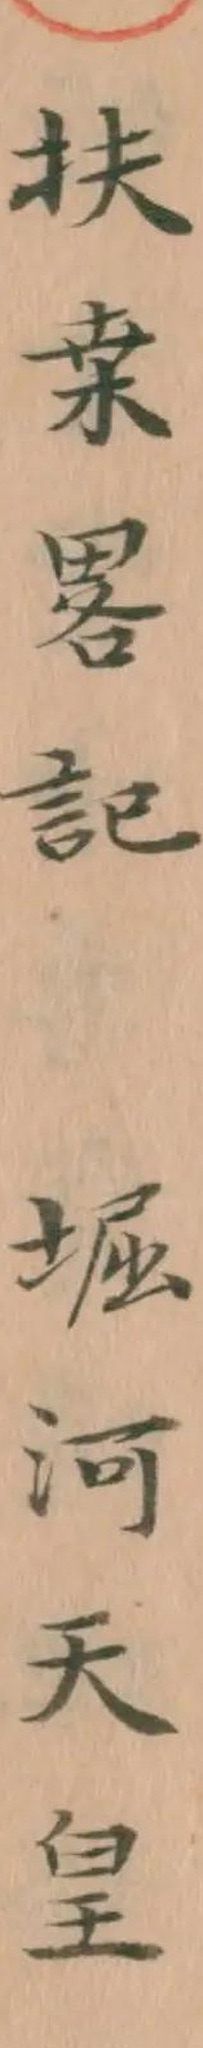○扶桑略記堀河天皇
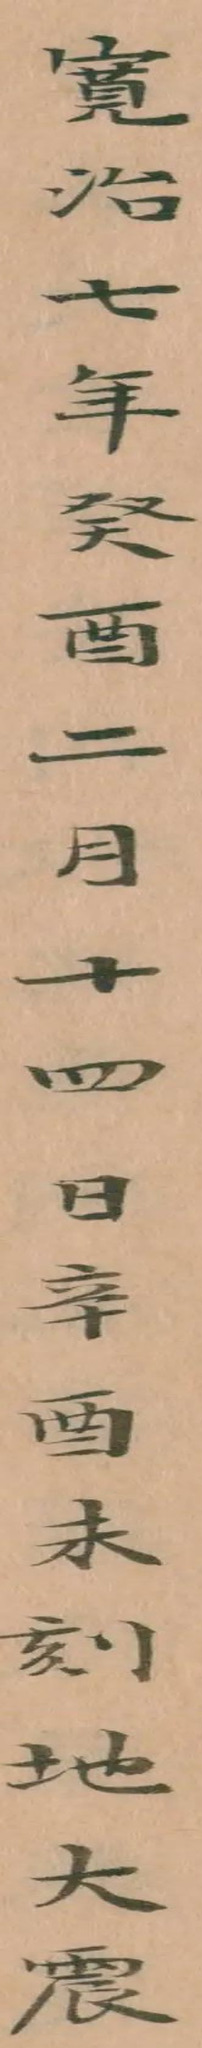寛治七年癸酉二月十四日辛酉未刻地大震
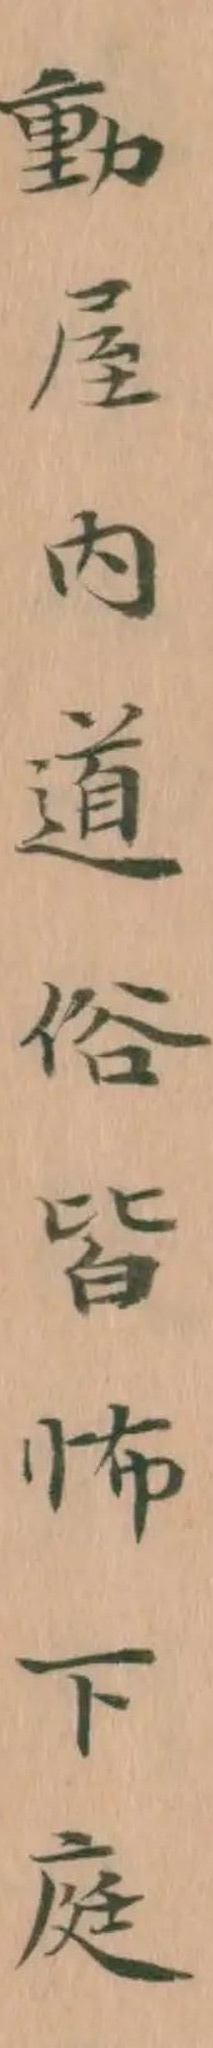動屋内道俗皆怖下庭
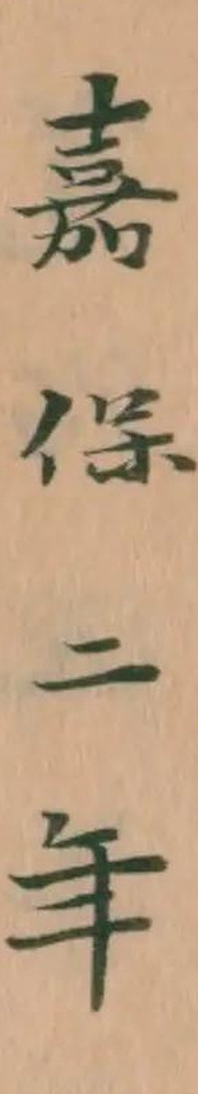嘉保二年
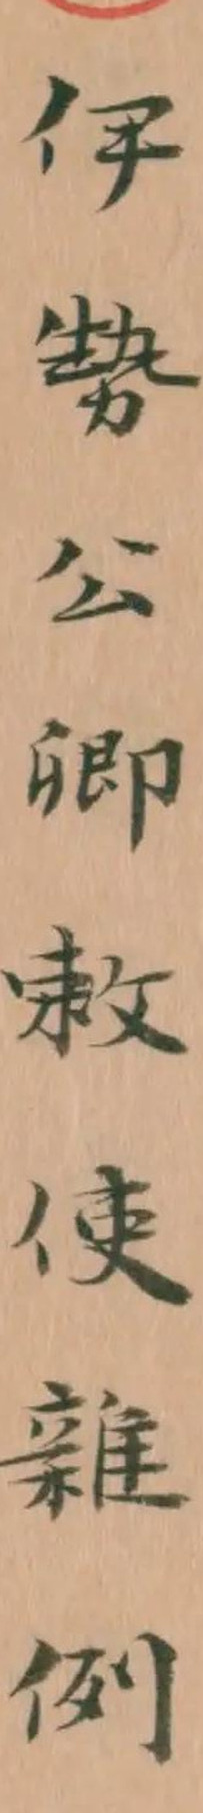○伊勢公卿勅使雑例
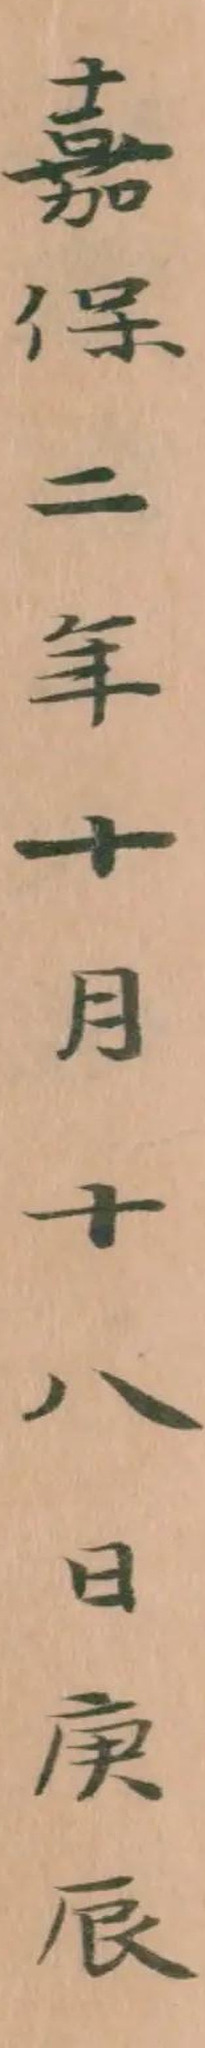嘉保二年十月十八日庚辰
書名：地災撮要. 巻5-6(地震之部)
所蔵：国立国会図書館 National Diet Library, JAPAN
